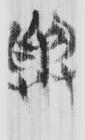與
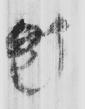飤
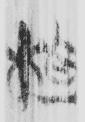相
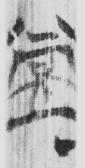當
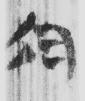今
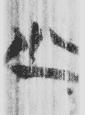少
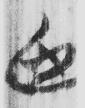臣
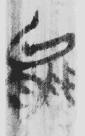能
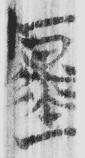廛
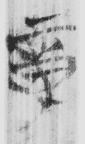章
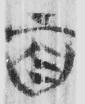百
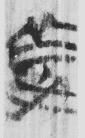義
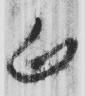㠯（以）
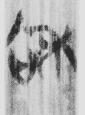和
